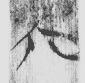六
